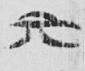亓
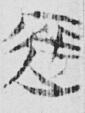𨒫（將）
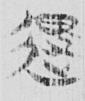{辶卑}（卑）
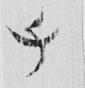父
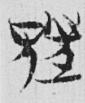○（兄）
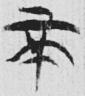不
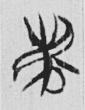廌（薦）
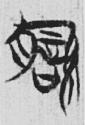䌛（由）
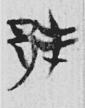邦
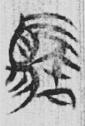{馬卸}（御）
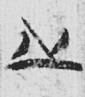之
